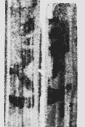是
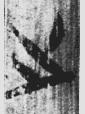之
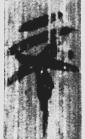不
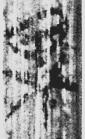果
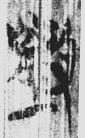毀
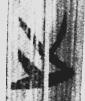之
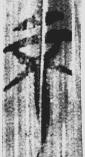不
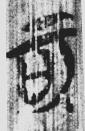可
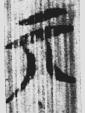亓（其）
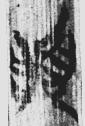○（狀）
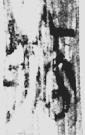膏（驕）
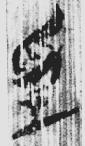○（淫）
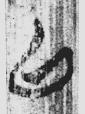㠯（以）
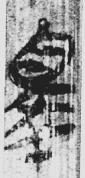睪
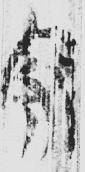罙
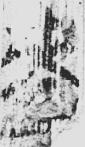○（來）
